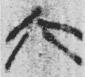六
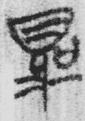鳴
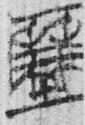○（謙）
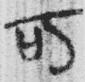可
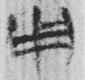用
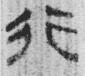行
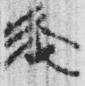帀（師）
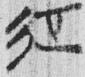征
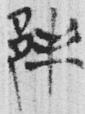邦
